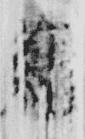○（勸）
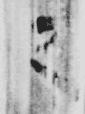也
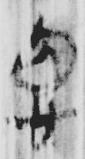○（溫）
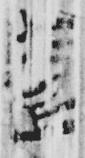良
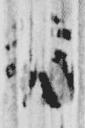而
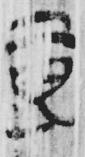忠
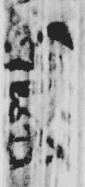敬
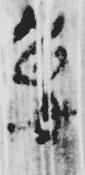○（仁）
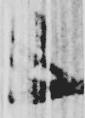之
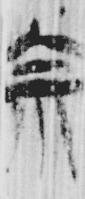宗
